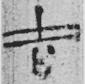吉
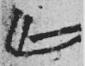亡
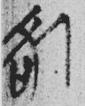咎
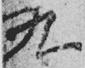九
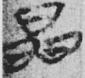晶
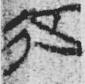征
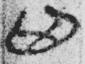凶
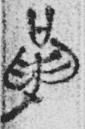革
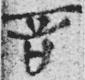言
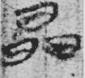晶（三）
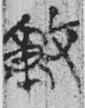○（就）
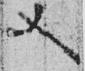又
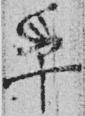孚
